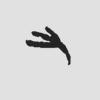又
